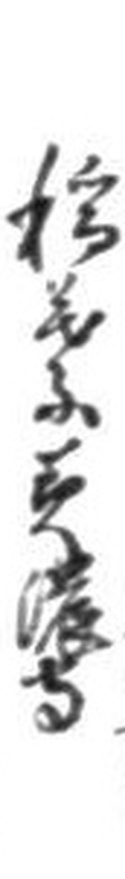稲葉美濃守
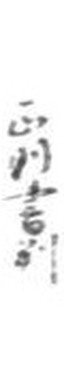正則書判
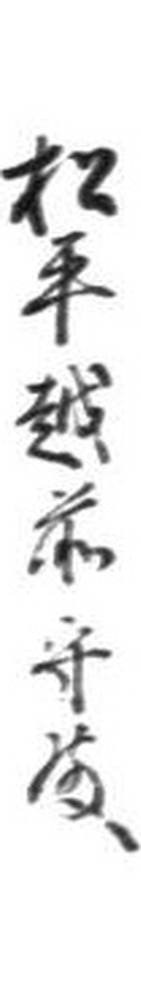松平越前守殿
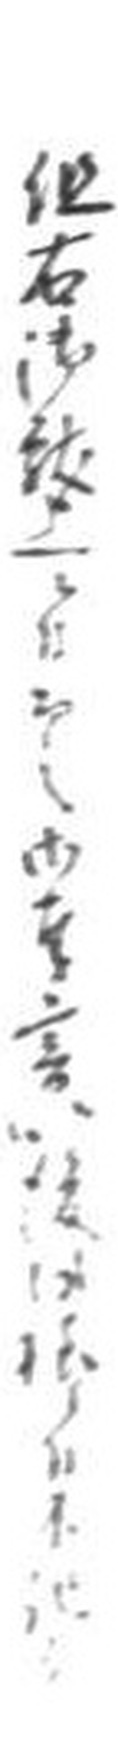但右御献上ニ付而之御奉書以後同様ニ付不記之

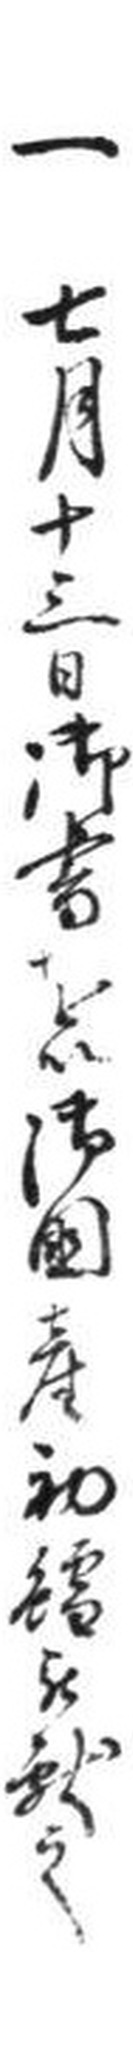一七月十三日御書を以御国産初鱈被献之
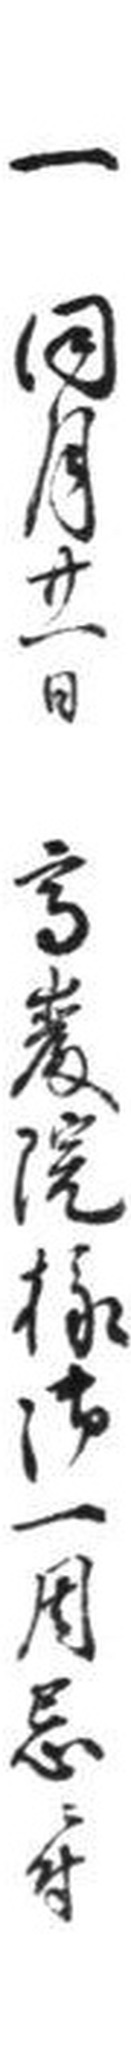一同月廿一日高巌院様御一周忌ニ付
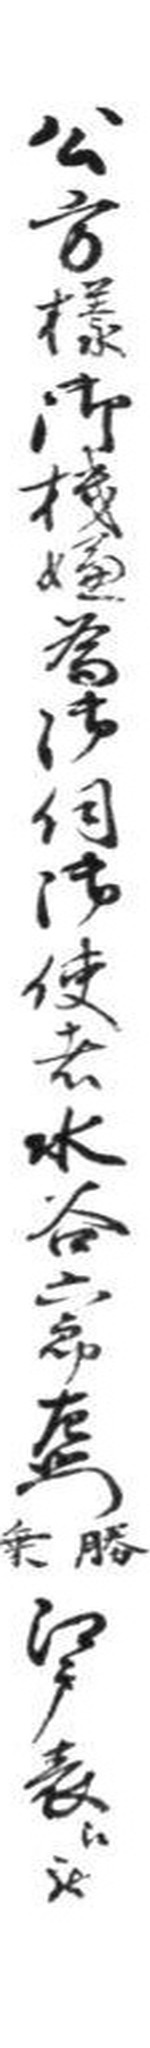公方様御機嫌為御伺御使者水谷六郎左衛門勝乗江戸表江被
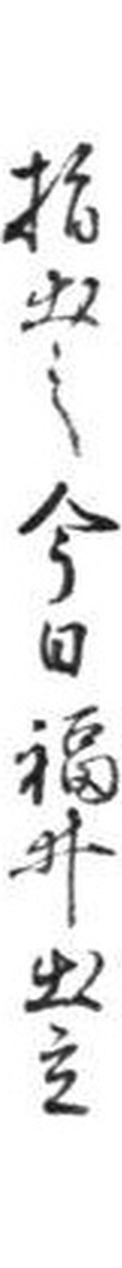指出之今日福井出立
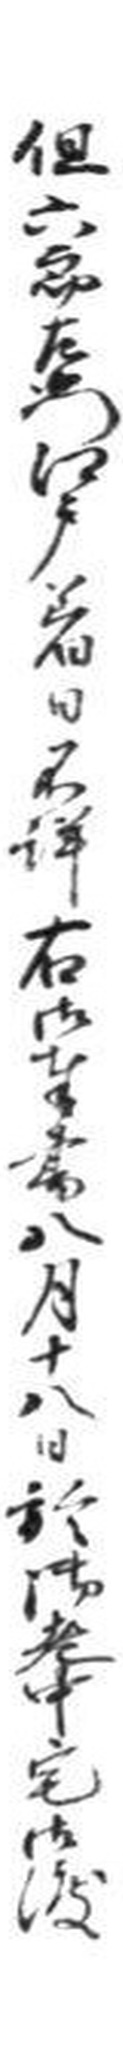但六郎左衛門江戸着日不詳右御奉書八月十八日於御老中宅御渡
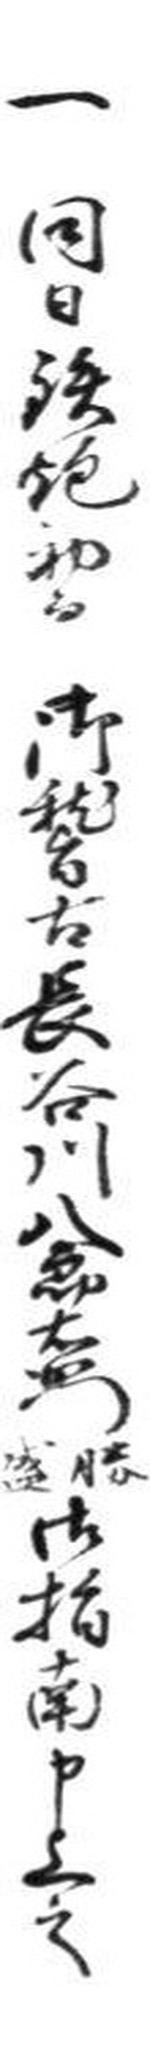一同日鉄砲初而御稽古長谷川八郎右衛門勝盛御指南申上之
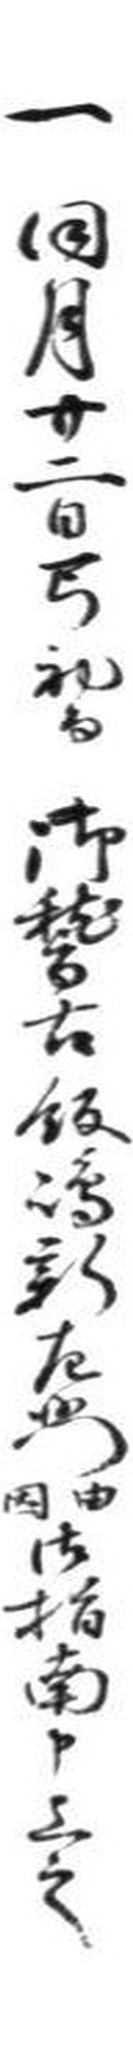一同月廿二日弓初而御稽古飯嶋新左衛門由因御指南申上之
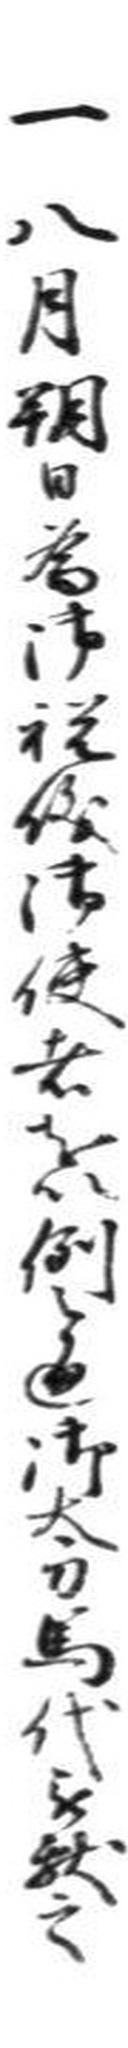一八月朔日為御祝儀御使者を以例之通御太刀馬代被献之
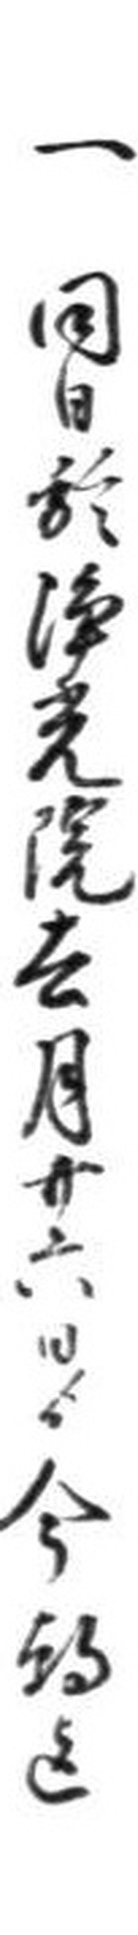一同日於浄光院去月廿六日ゟ今朝迄
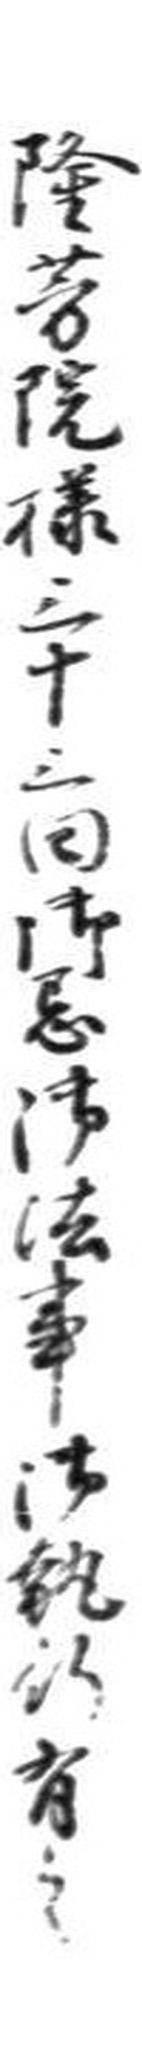隆芳院様三十三回御忌御法事御執行有之
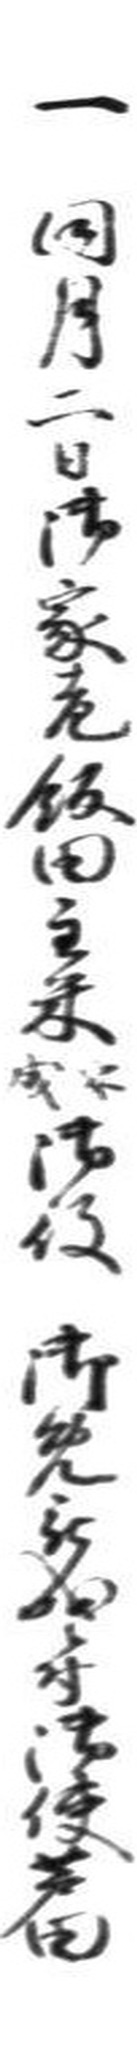一同月二日御家老飯田主米安成御役御免被成ニ付御使芦田
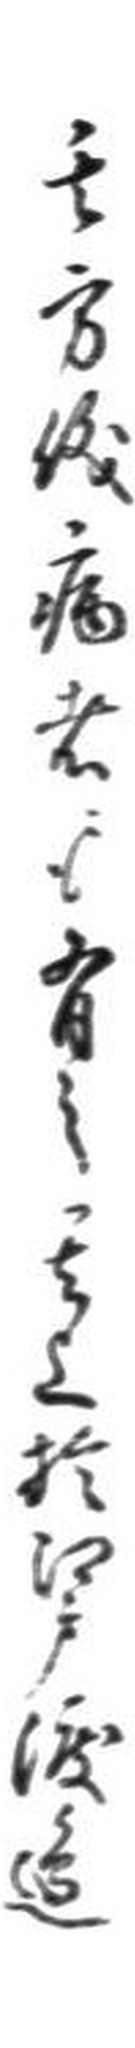其方儀病者ニも有之其上於江戸渡辺
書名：家譜 十三 綱昌公 従寛文元年到延宝五年
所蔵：福井県文書館 Fukui Prefectural Archives
